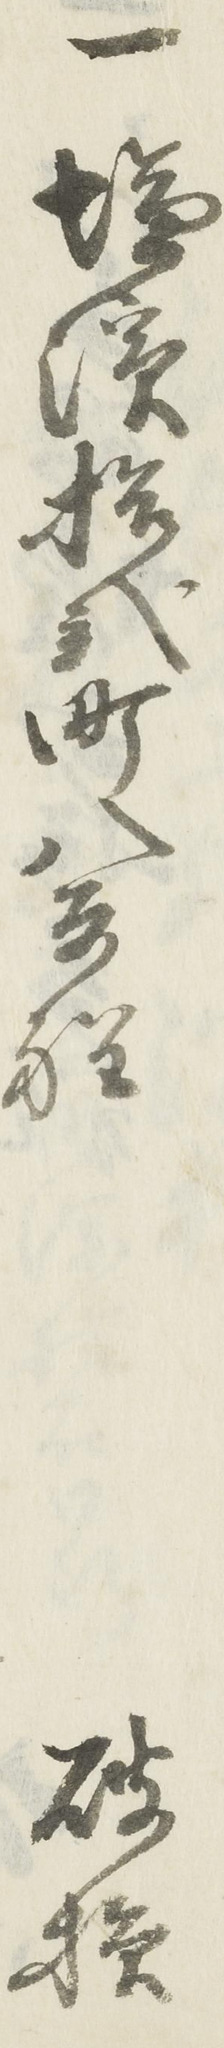一塩浜拾弐町八反程破損
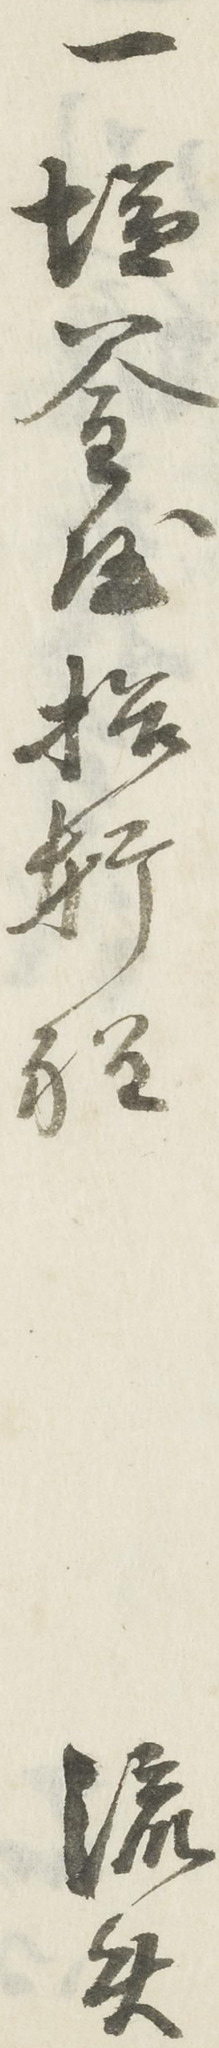一塩釜屋拾軒程流失
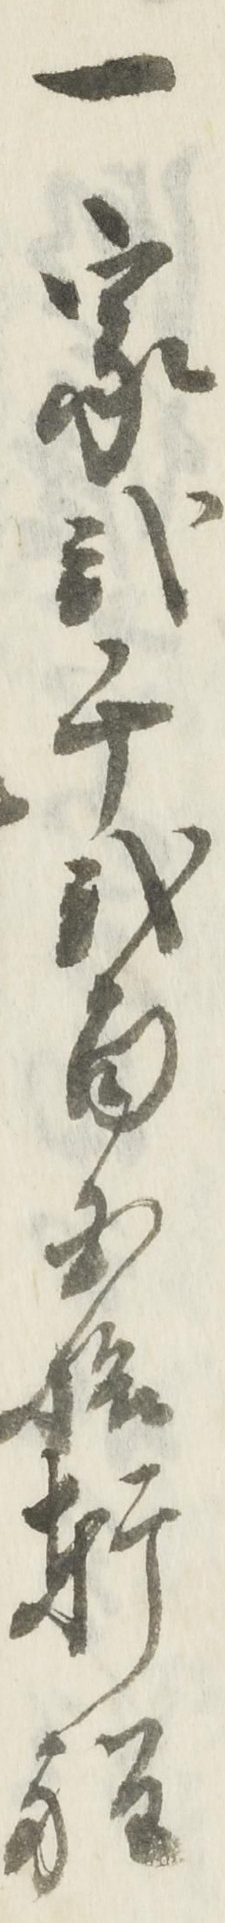一家弐千二百五十軒程
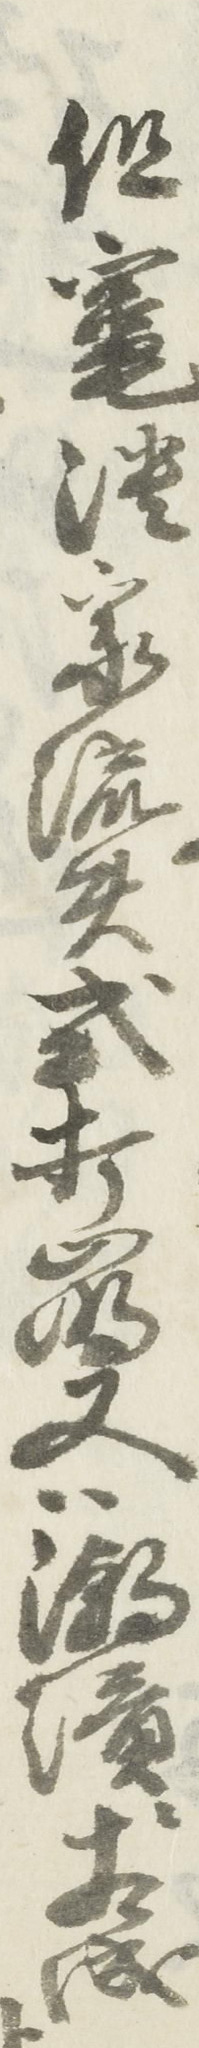但竃潰家流失或打崩又は潮漬ニ相成分
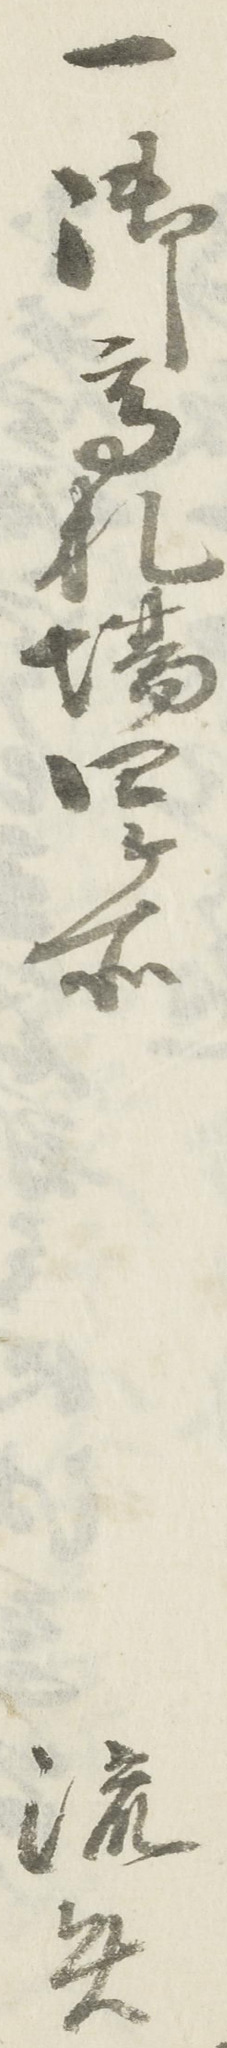一御高札場四ケ所流失
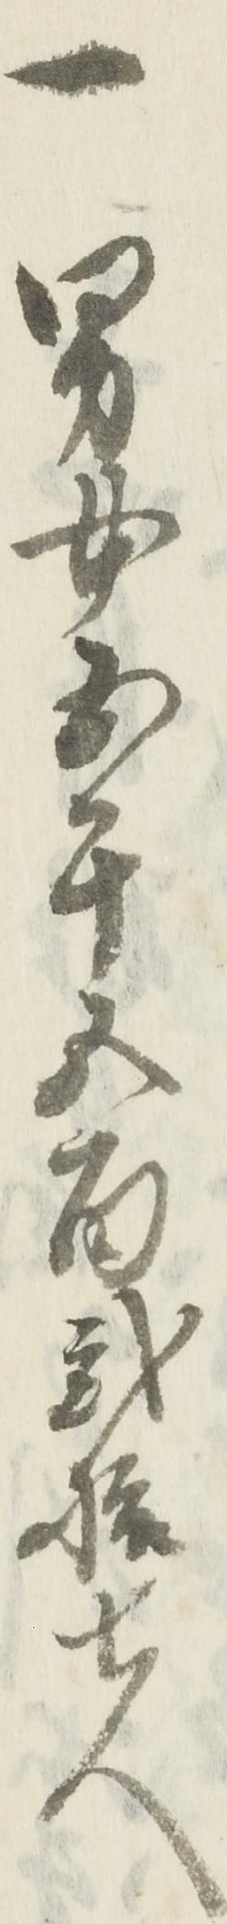一男女五千五百二拾七人
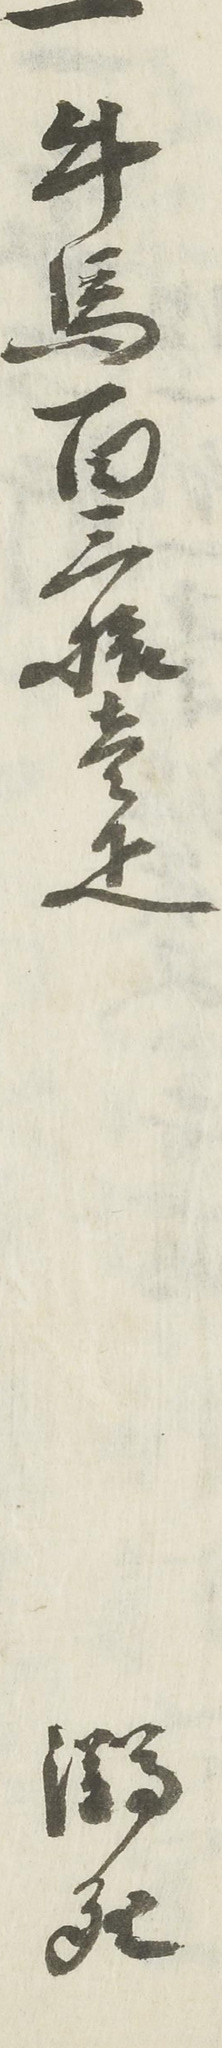一牛馬百三拾壱疋溺死
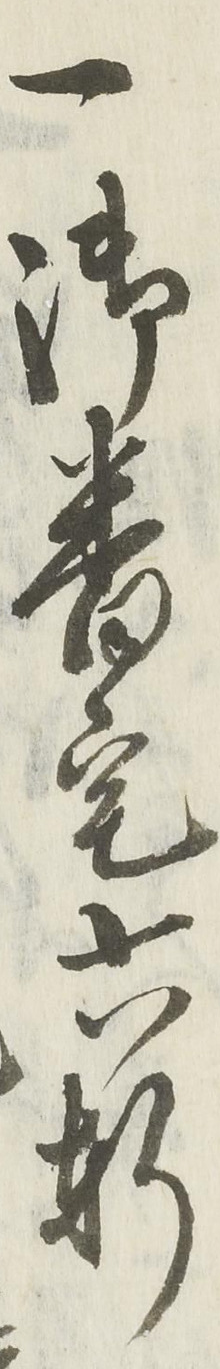一御番宅六軒
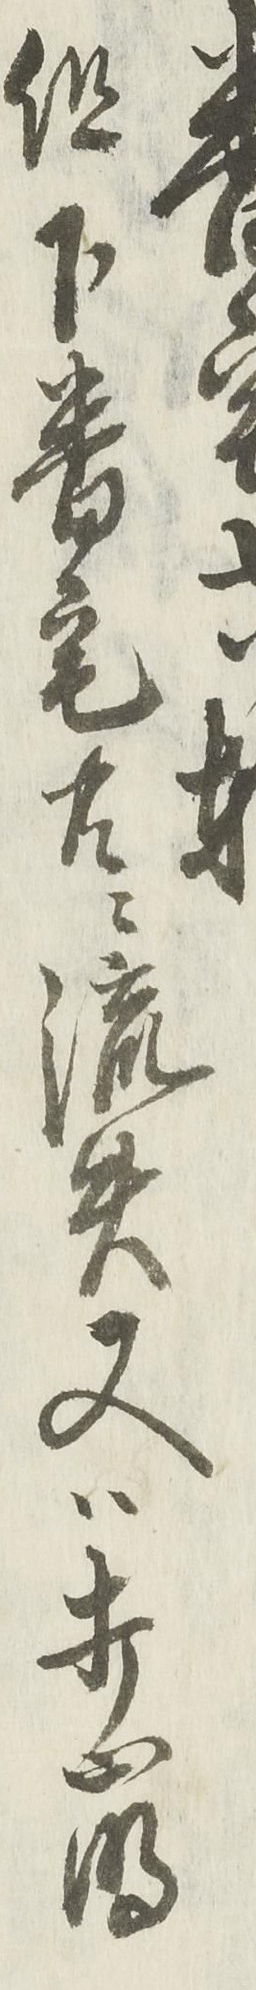但下番宅左ニ流失又は打崩
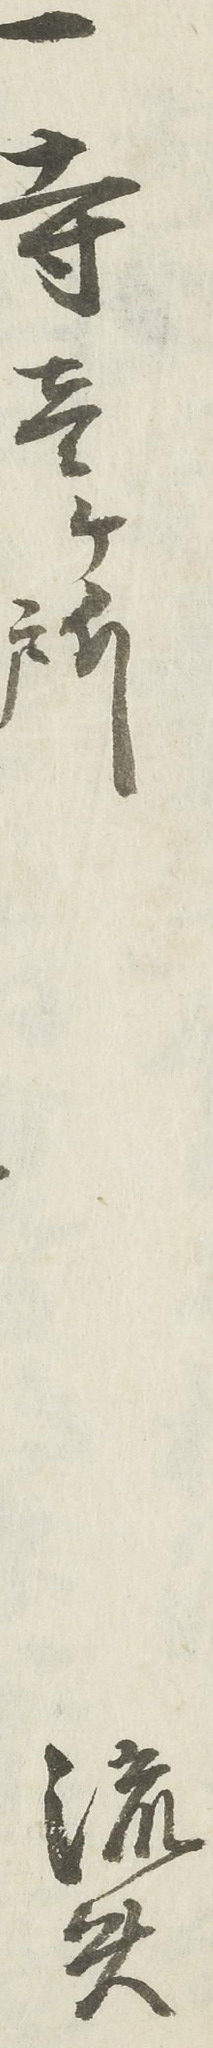一寺壱ケ所流失
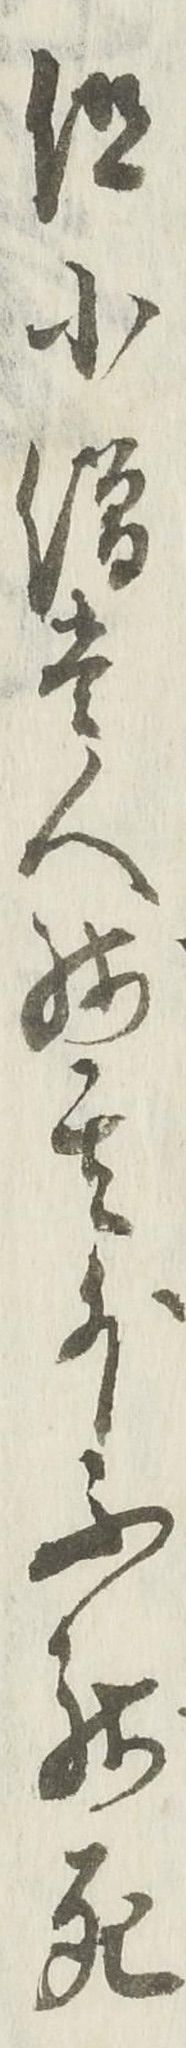但小僧壱人残其外不残死
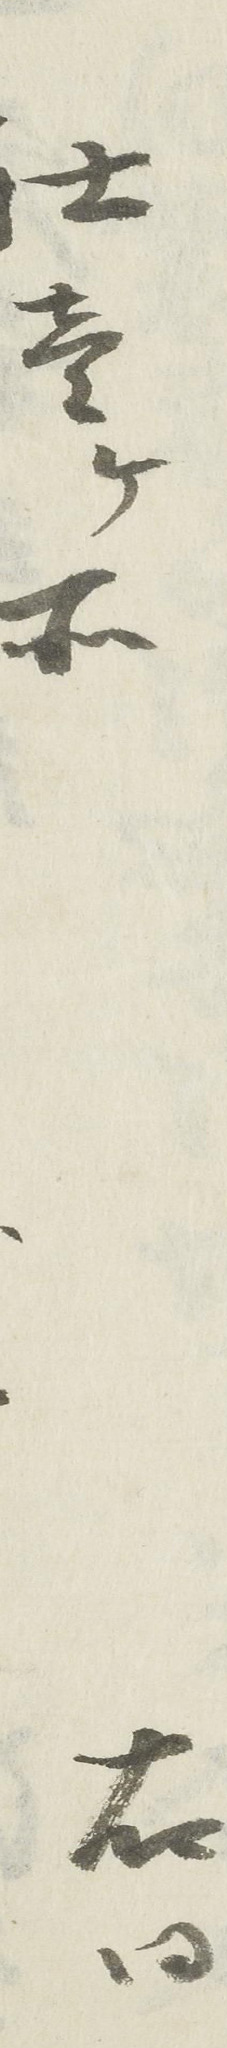一社壱ケ所右同
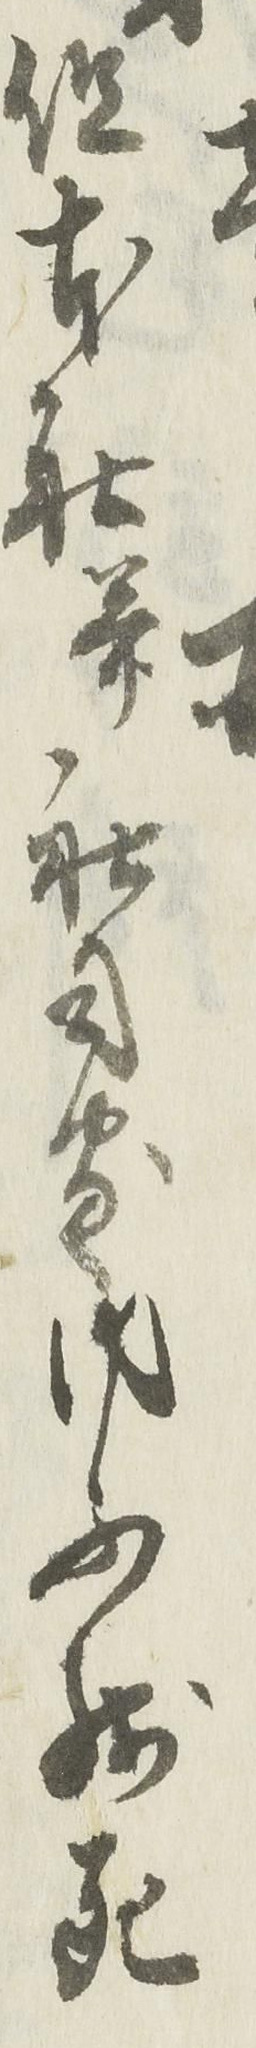但本社并社司家内不残死
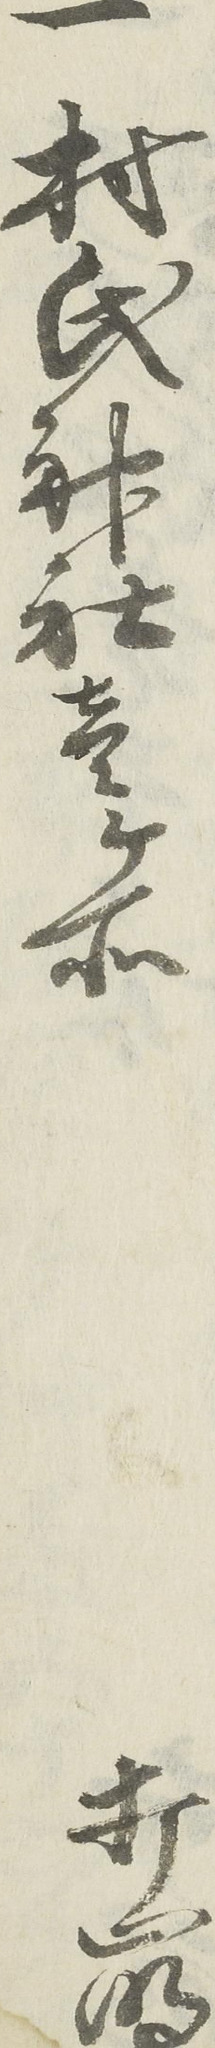一村民神社壱ケ所打崩

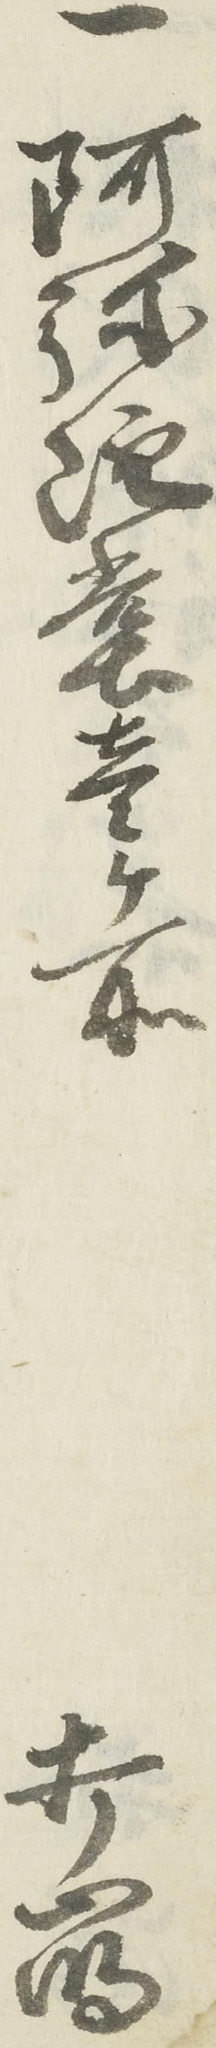一阿弥陀堂壱ケ所打崩
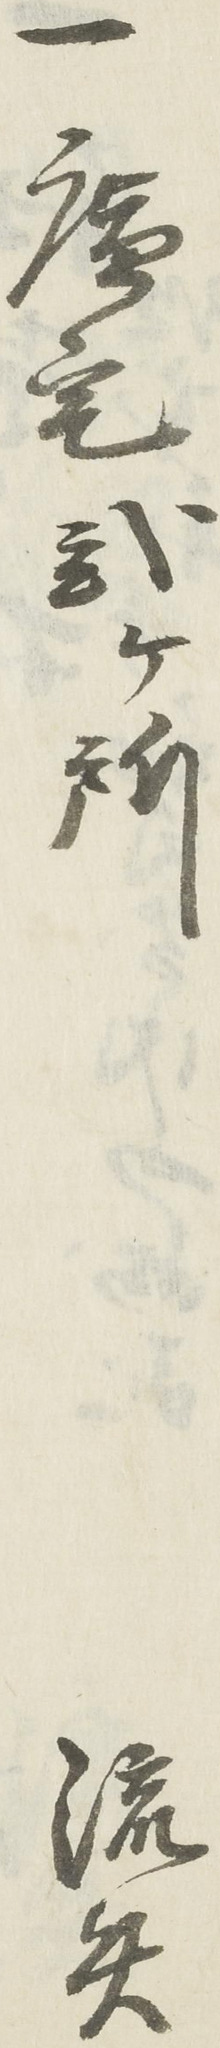一庭宅弐ケ所流失
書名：後見笑
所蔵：東京大学地震研究所図書室 Earthquake Research Institute Library, The University of Tokyo, JAPAN
